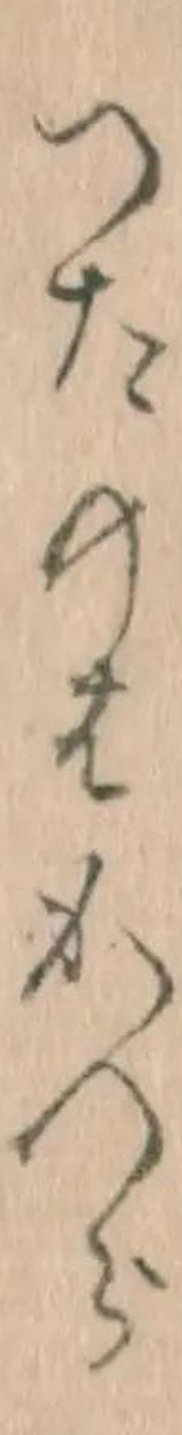つたのはかつら
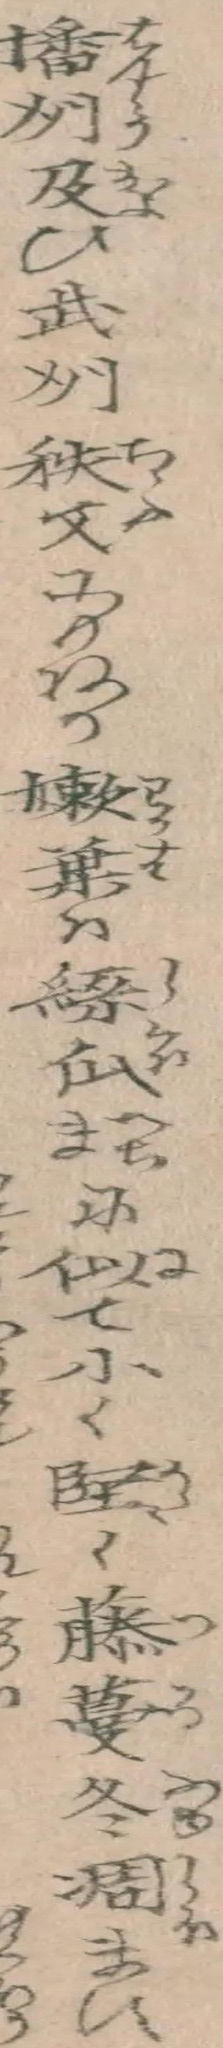播州及ひ武州秩父にもあり嫩葉は糸瓜へちまに似て小く堅し藤蔓冬凋ます
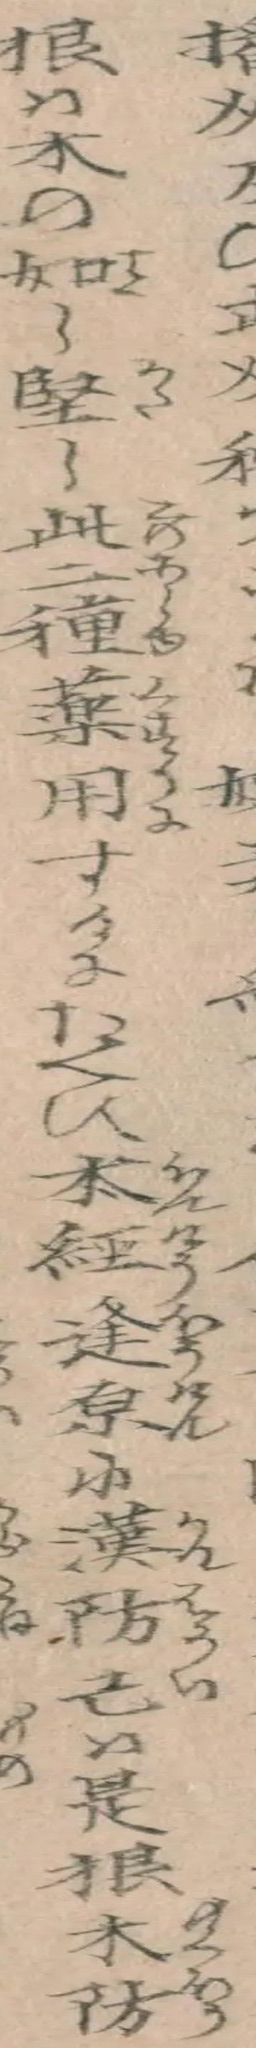根は木の如し堅し此二種薬用するにたへす本経逢原に漢防己は是根木防
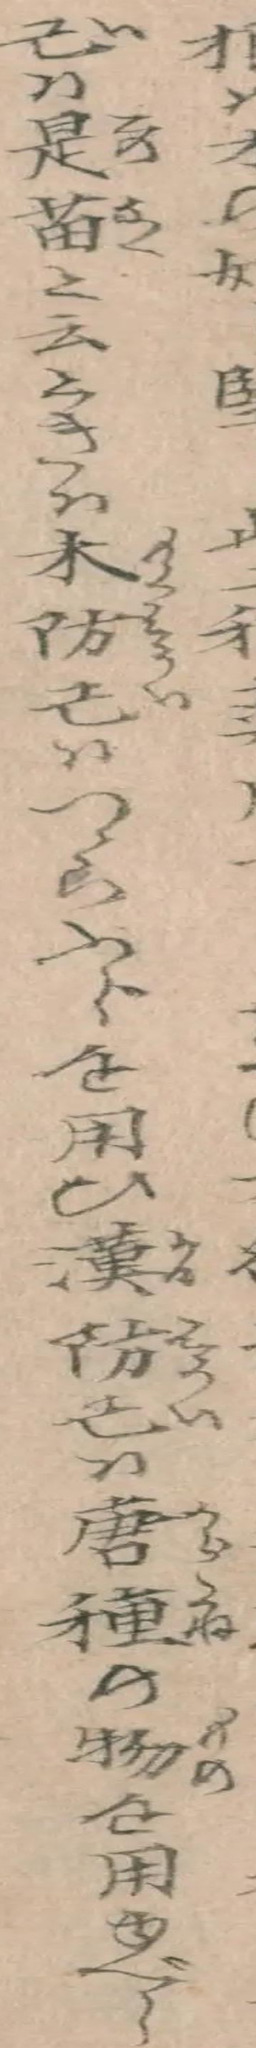己は是苗と云ときは木防己はつゝらふじを用ひ漢防己は唐種の物を用ゆべし

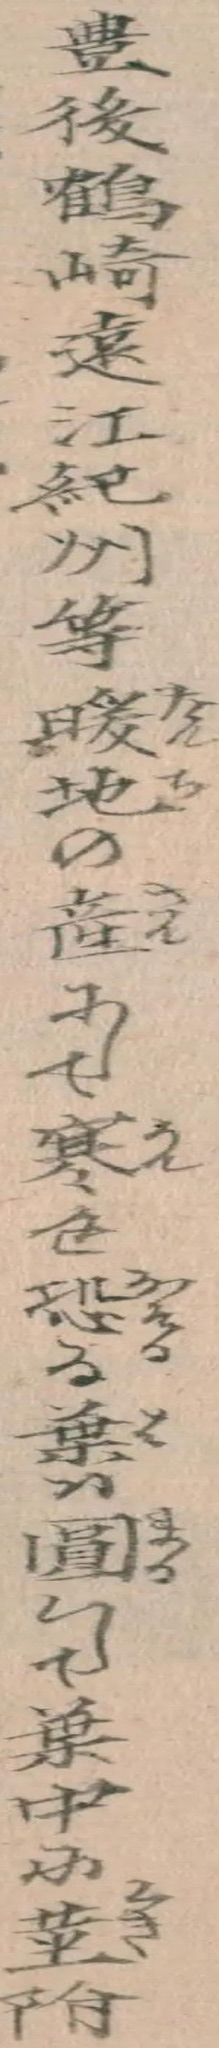豊後鶴崎遠江紀州等暖地の産にして寒を恐る葉は円くして葉中に茎附
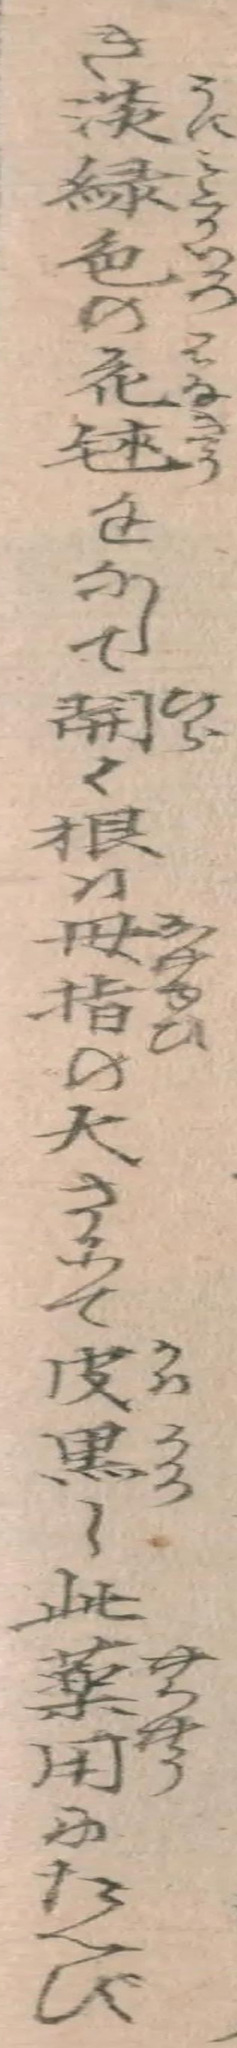き淡緑色の花毬をなして開く根は母指の大さにて皮黒し此薬用にたへず
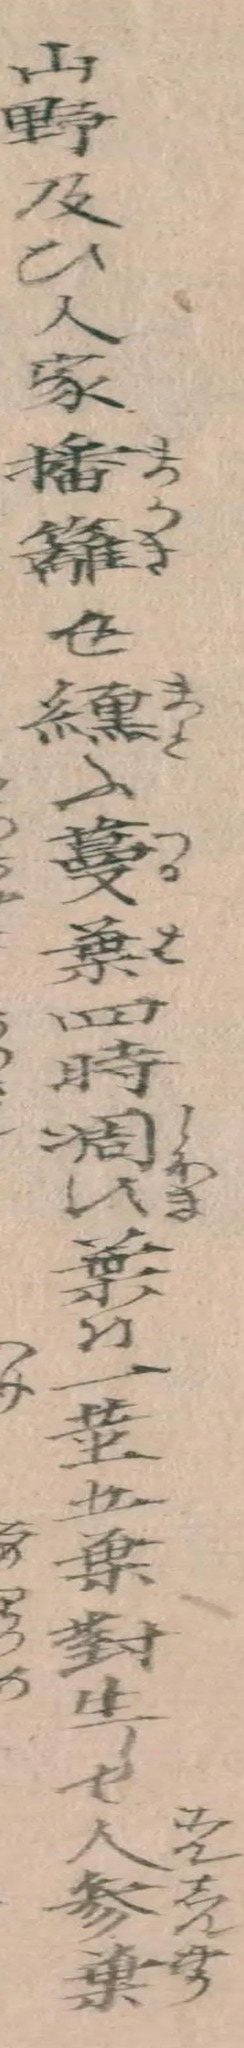山野及ひ人家播籠を纏ふ蔓葉四時凋す葉は一茎五葉対生して人参葉
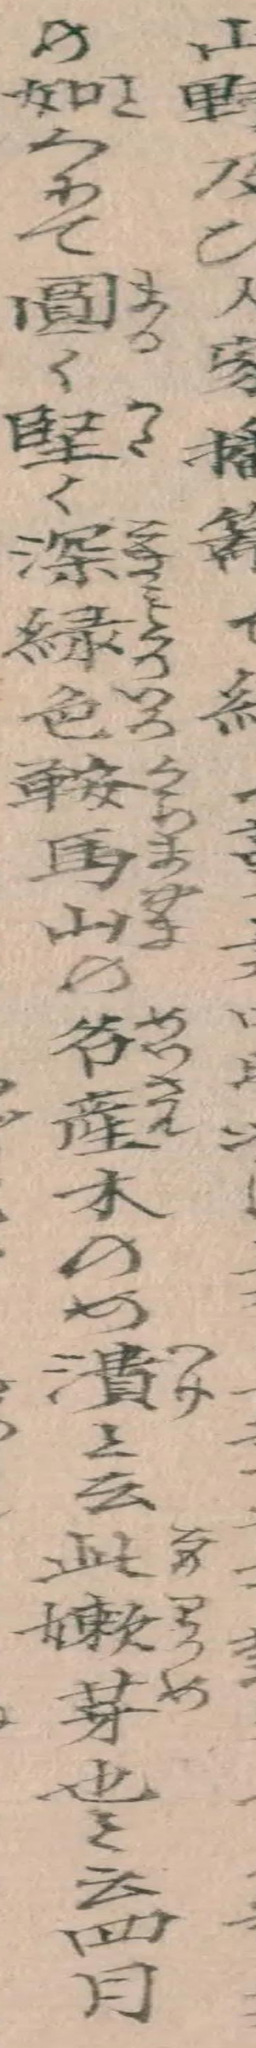の如くにて円く堅く深緑色鞍馬山の名産木のめ漬と云此嫩芽也と云四月
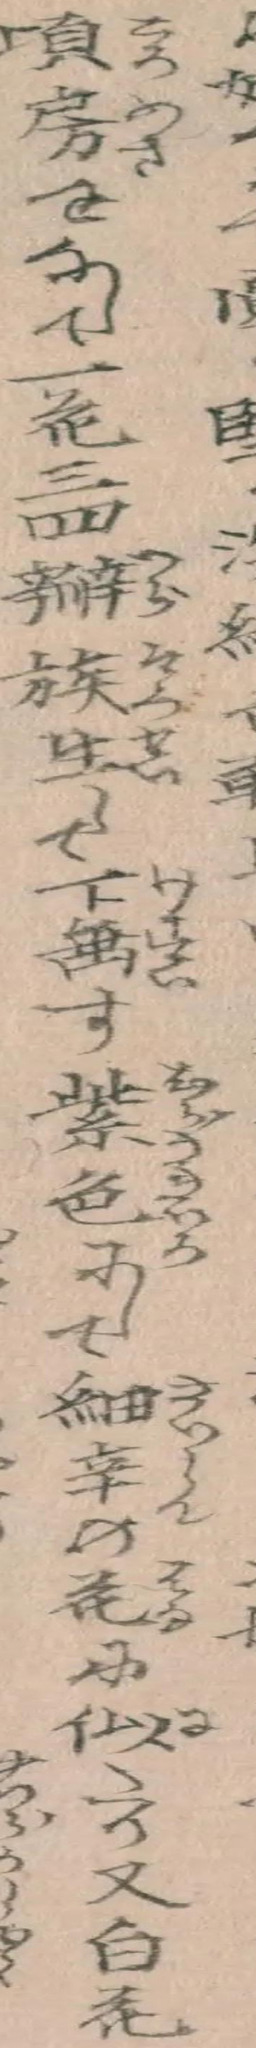頃房をなして一花三四弁族生して下垂す紫色にして細辛の花に似たり又白花
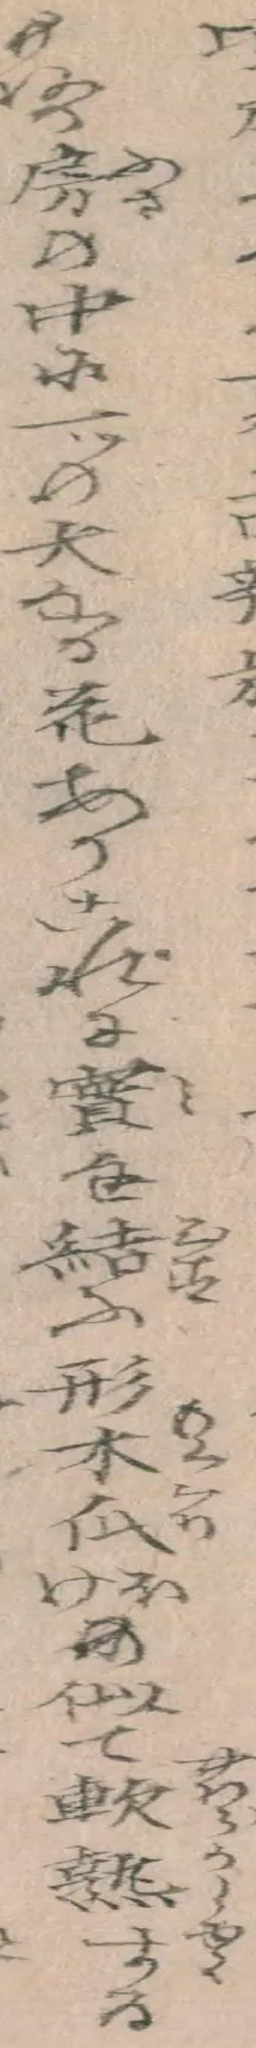もあり房の中に一つの大なる花ありこれに実を結ふ形木瓜ほけに似て軟熟する
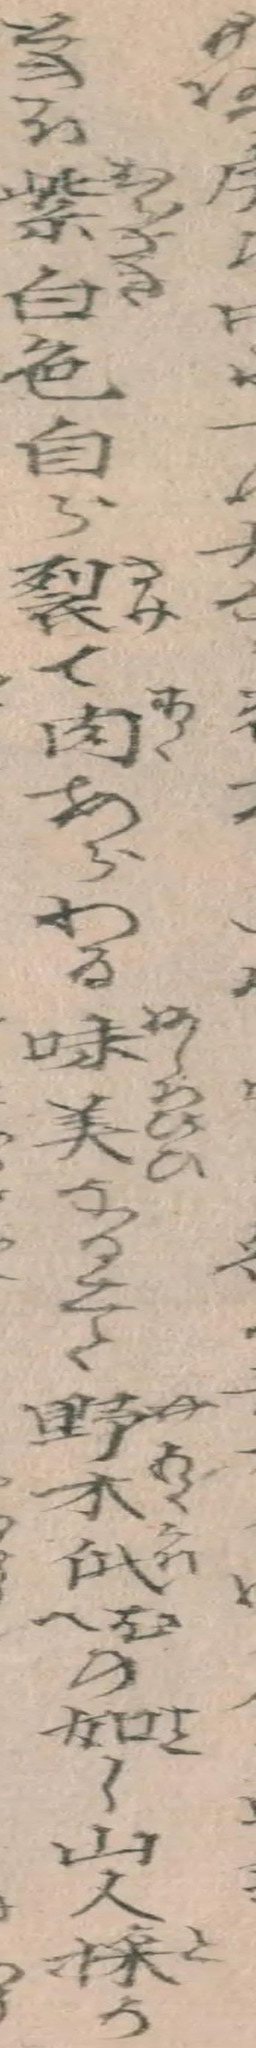ときは紫白色自ら裂て肉あらわる味美なること野木瓜むへの如し山人採り
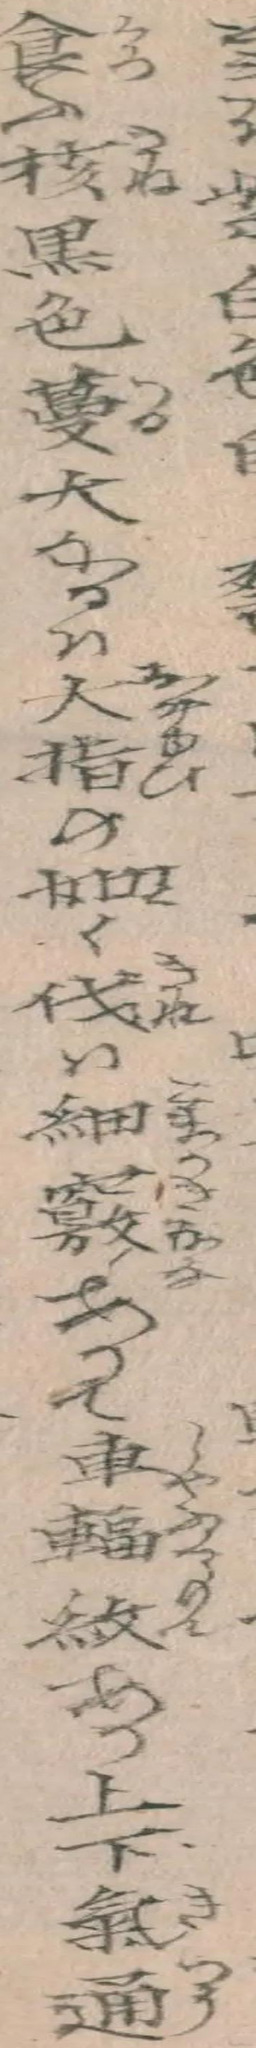食ふ核黒色蔓大なるは大指の如く伐は細竅ありて車輻紋あり上下気通
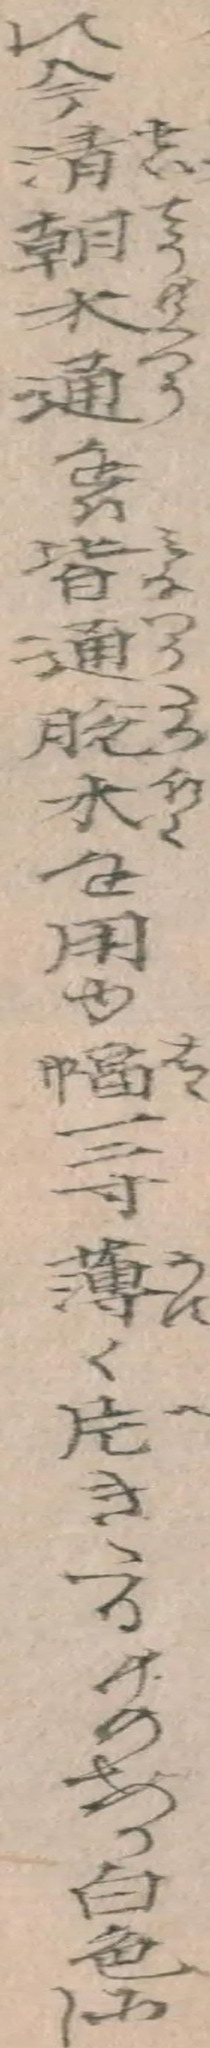す今清朝木通をは皆通脱木を用ゆ幅一二寸薄く片きたるものあり白色にし
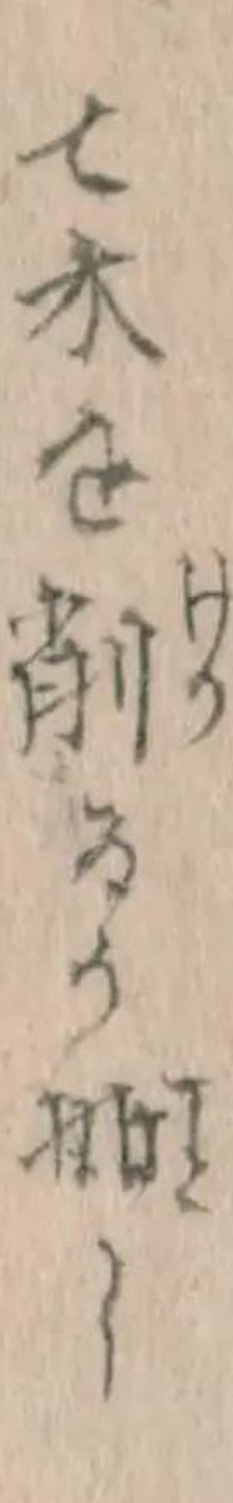て木を削るか如し
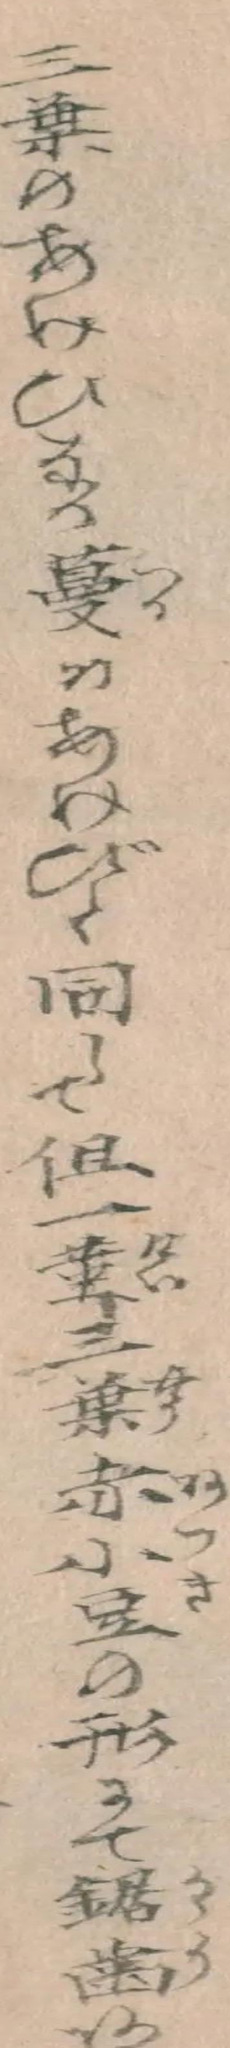三葉のあけひなり蔓はあけびと同して但一茎三葉赤小豆の形にて鋸歯あり
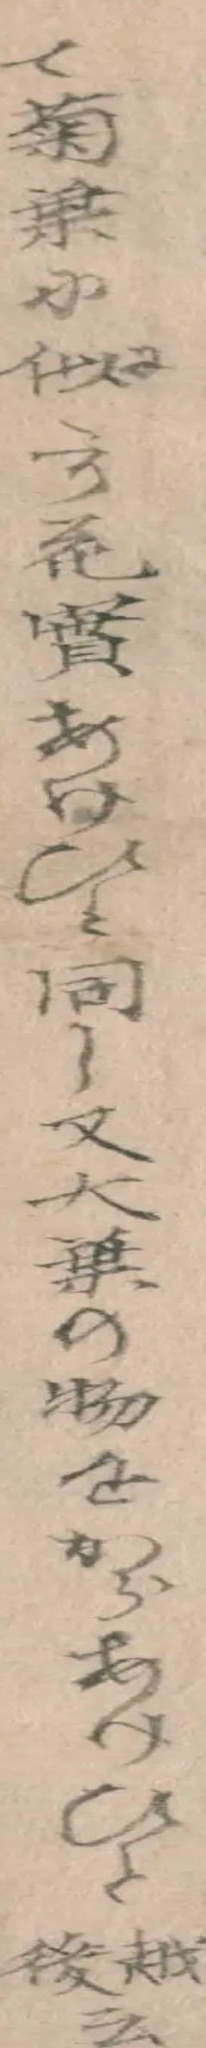て菊葉に似たり花実あけひと同し又大葉の物をからあけひと越後云
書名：本草図譜. 巻28-30
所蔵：国立国会図書館 National Diet Library, JAPAN
